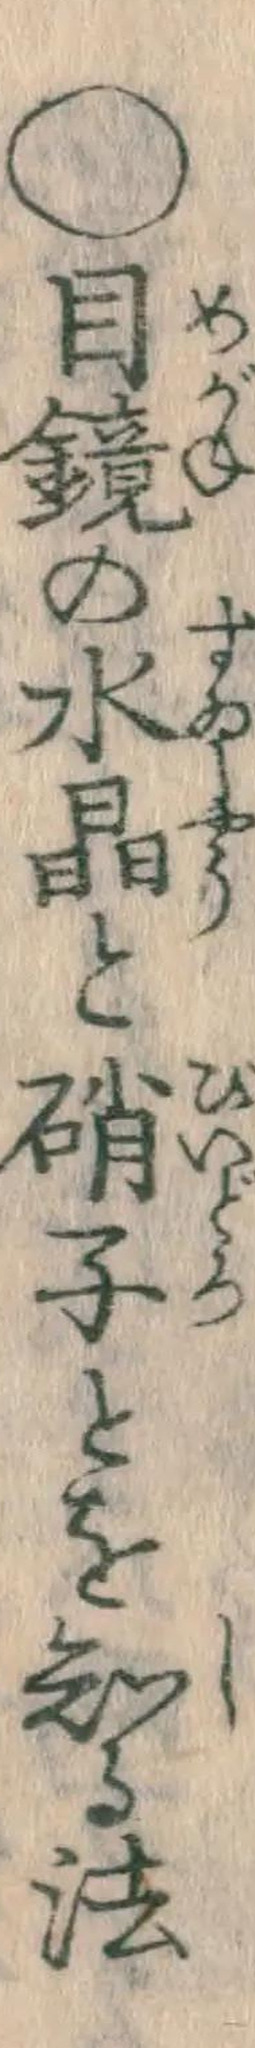○目鏡の水晶と硝子とを知る法
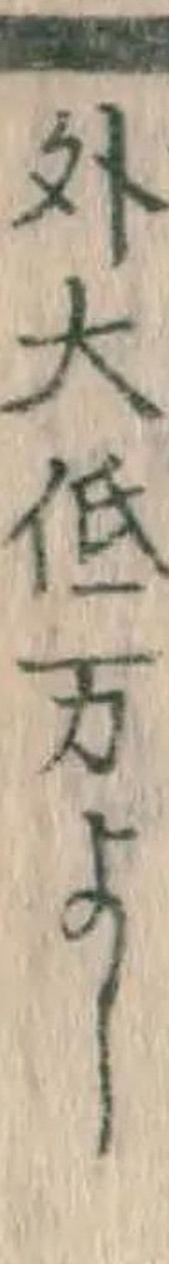外大低万よし
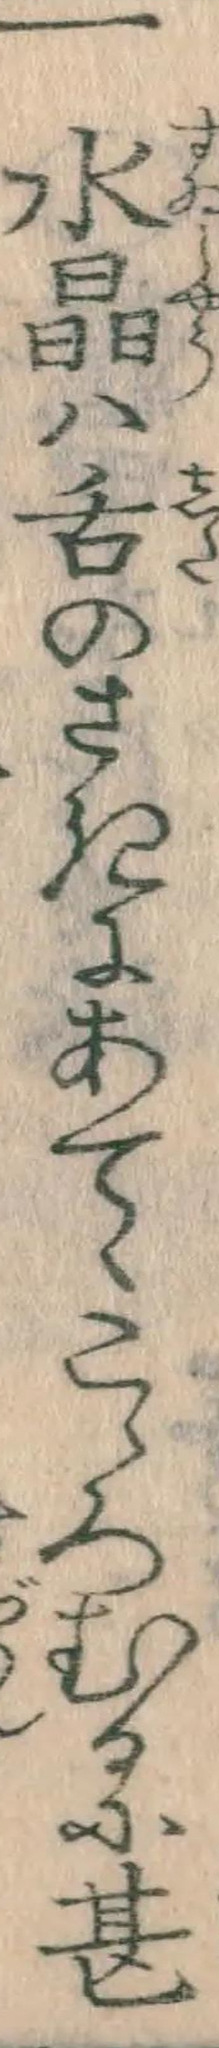一水晶は舌のさきにあてゝこゝろむるに甚
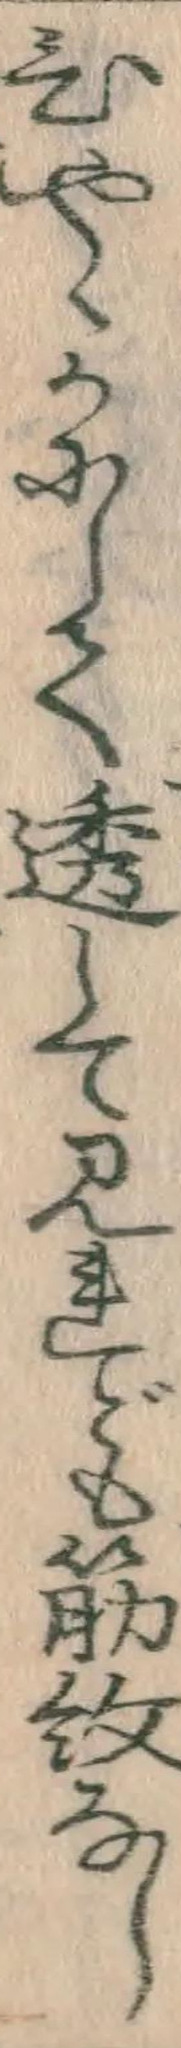ひやゝかにして透して見れども筋紋なし
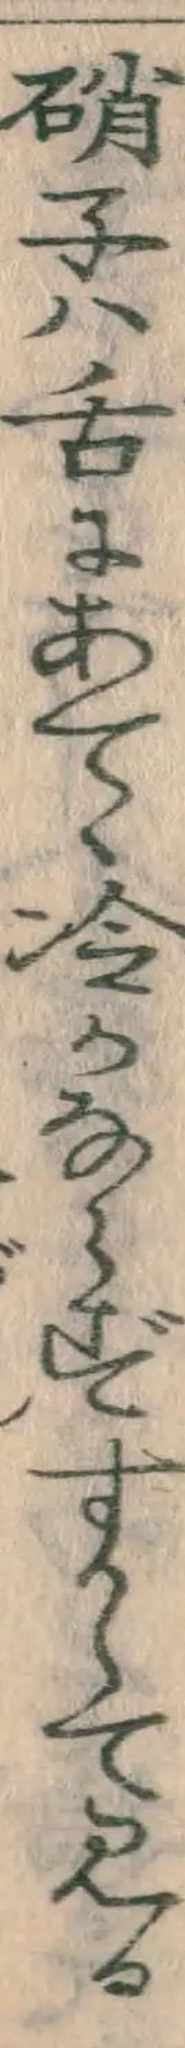硝子は舌にあてゝ冷かならずすかして見る
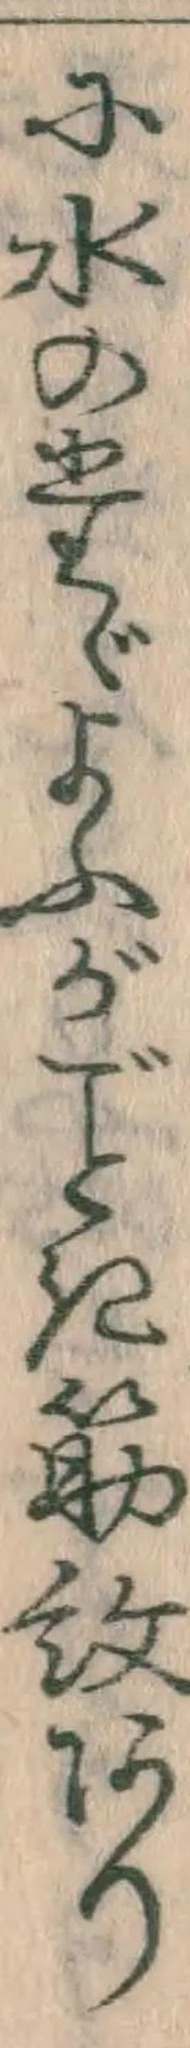に水のたゞよふがごとき筋紋あり
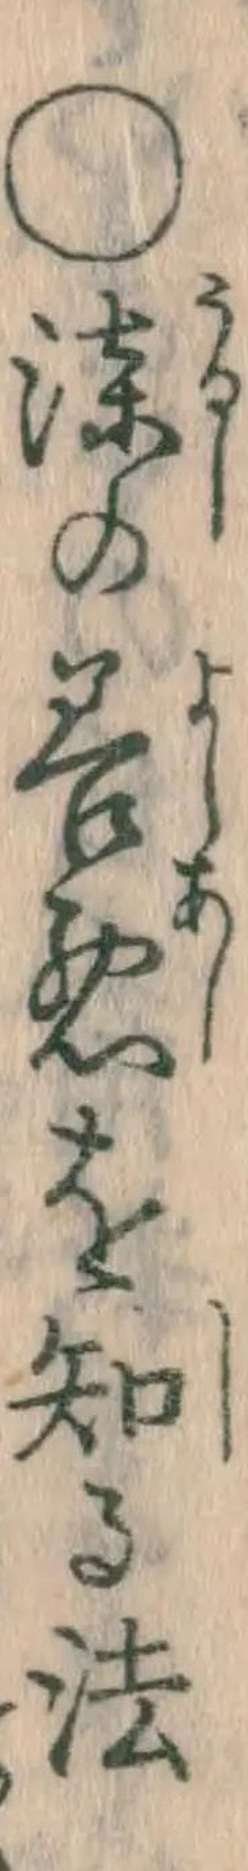○漆の善悪を知る法
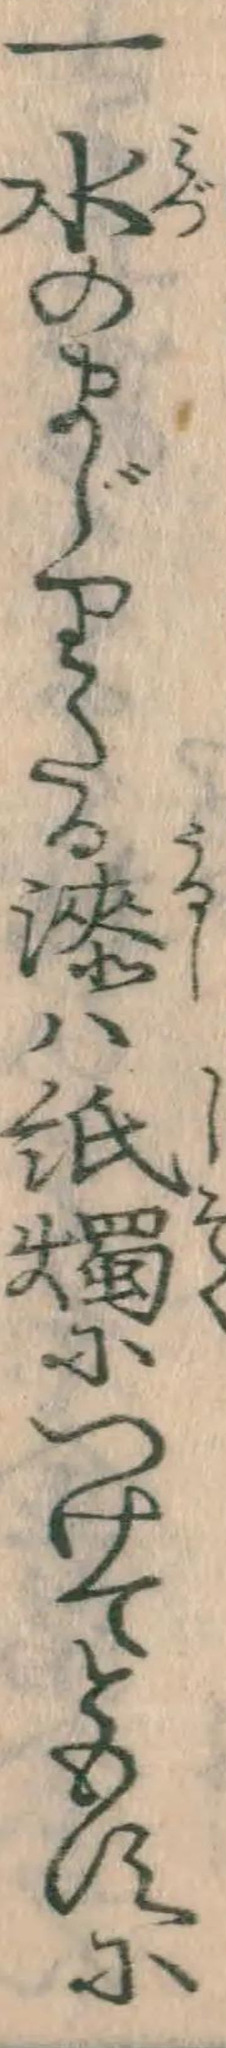一水のまじりたる漆は紙燭につけてともすに
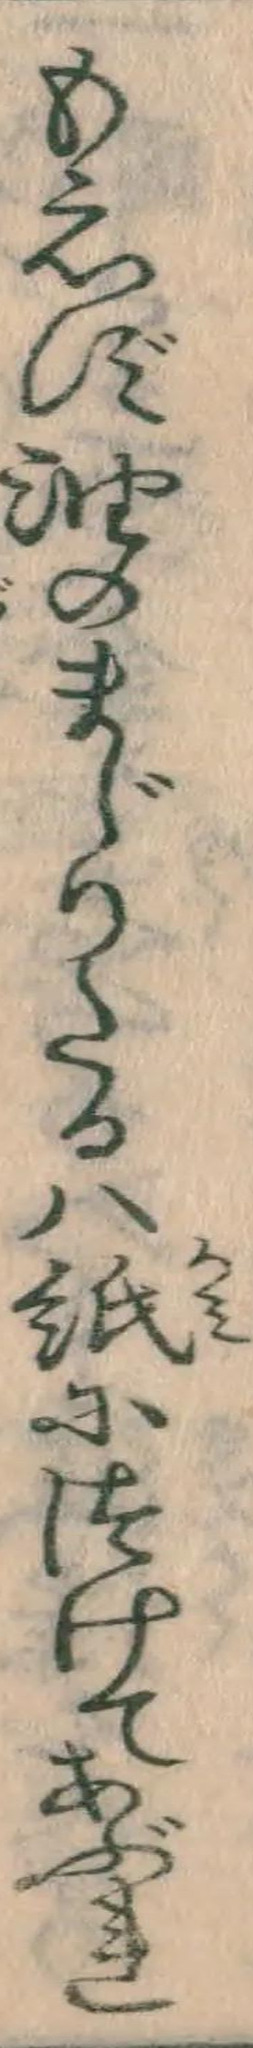もえず油のまじりたるは紙につけてあぶれ
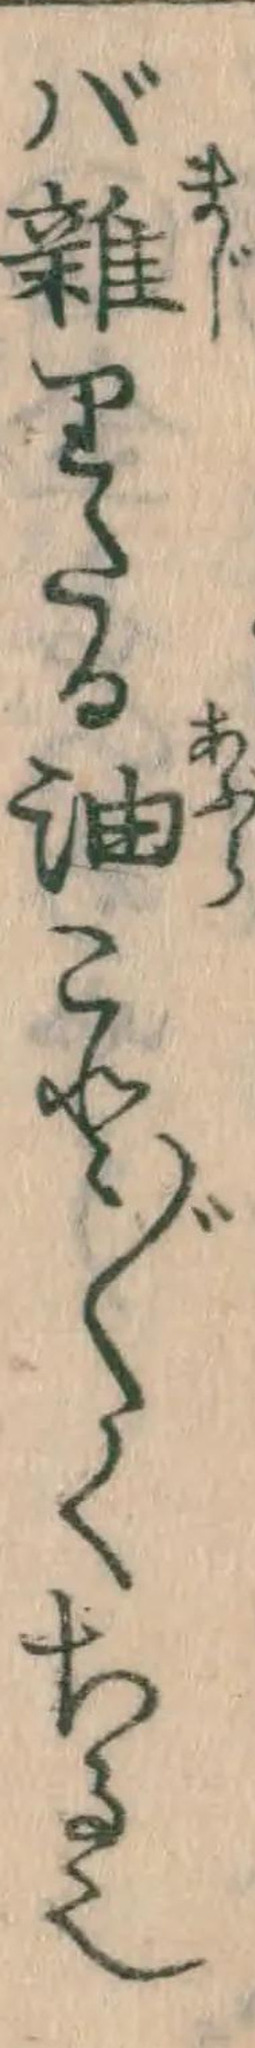ば雑りたる油こと〴〵くちる也
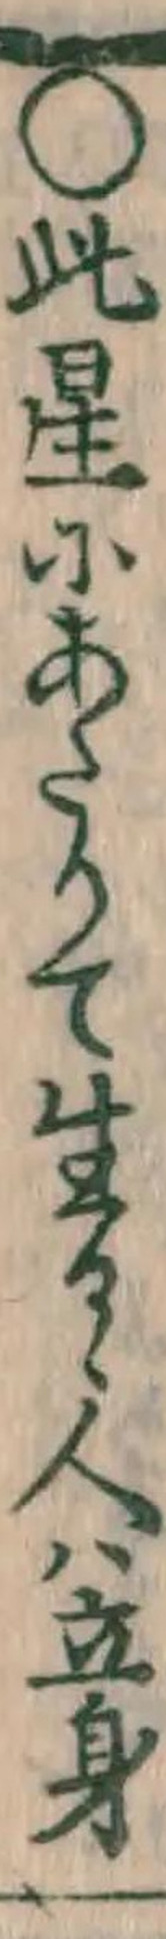○此星にあたりて生るゝ人は立身
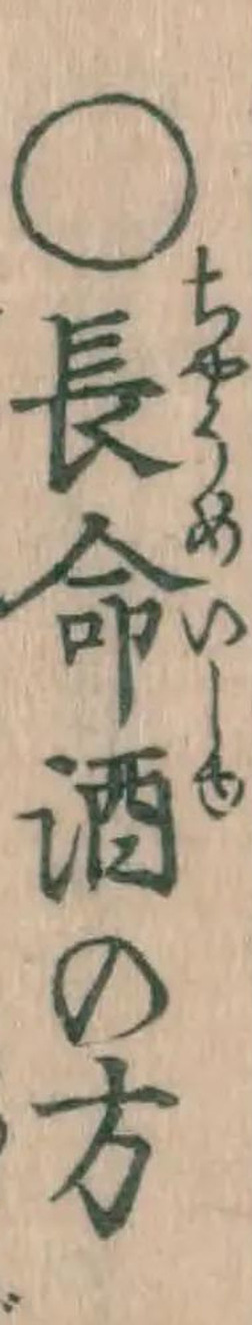○長命酒の方
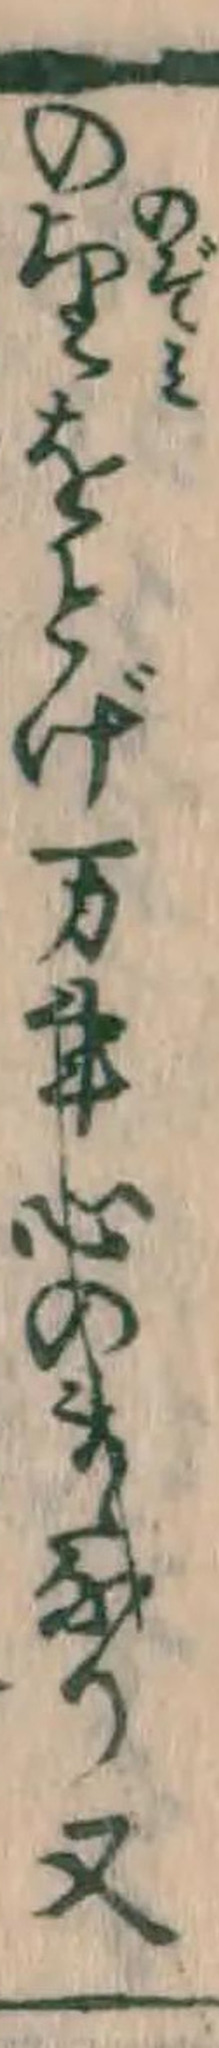の望をとげ万事心のまゝなり又
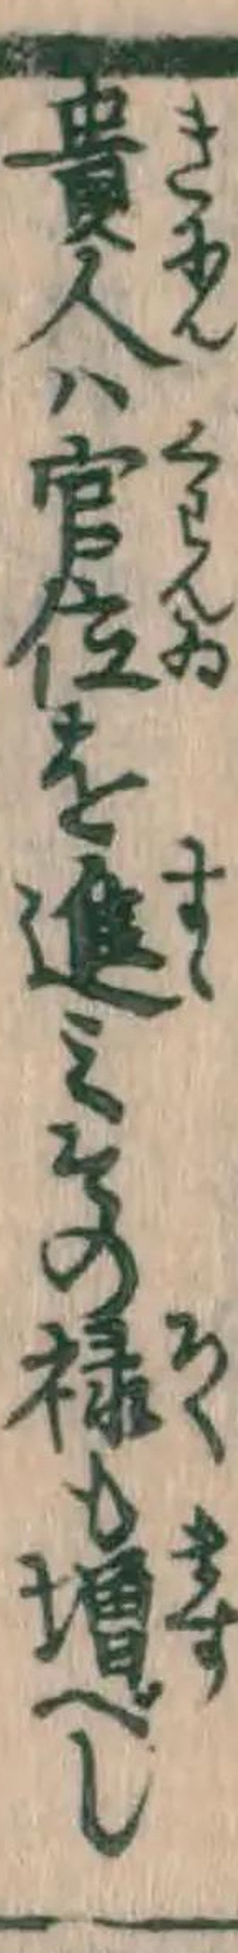貴人は冠位を進みその禄も増べし
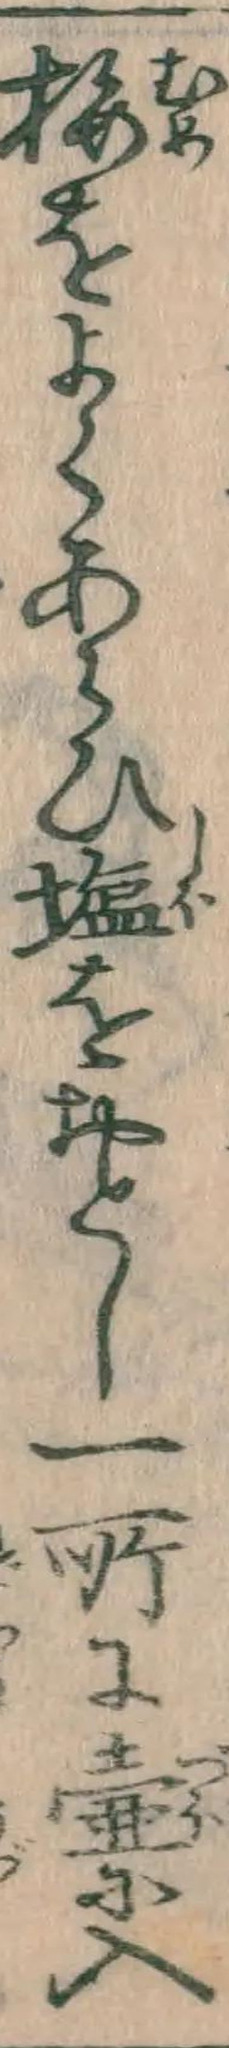梅をよくあらひ塩をおとし一所に壺に入
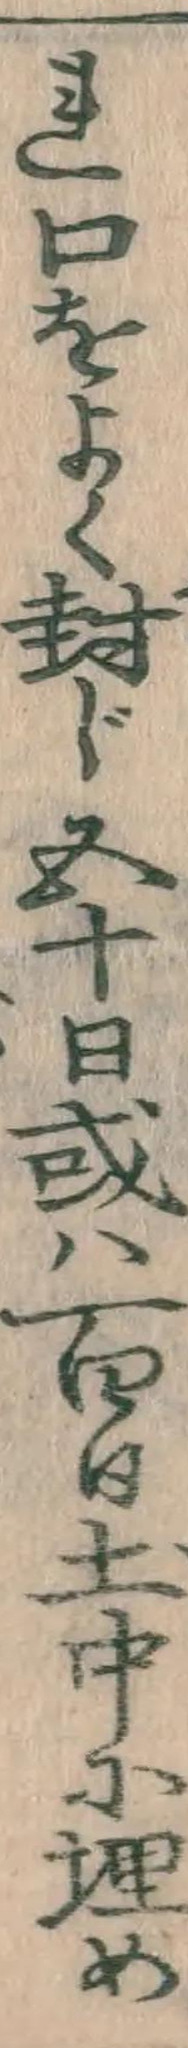れ口をよく封じ五十日或は百日土中に埋め
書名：広益秘事大全 3巻. [2]
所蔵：国立国会図書館 National Diet Library, JAPAN
